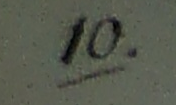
10.
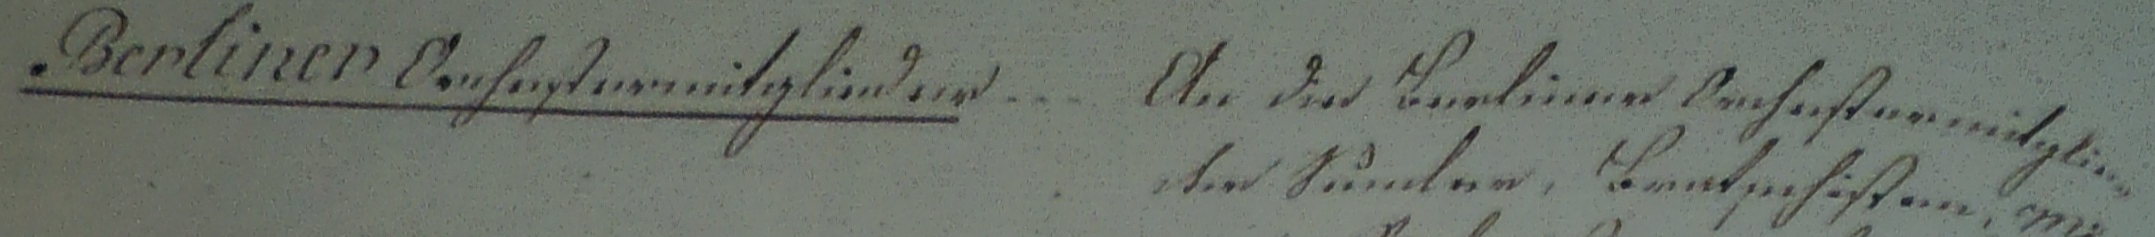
Berliner Orchestermitglieder … An die Berliner Orchestermitglieder
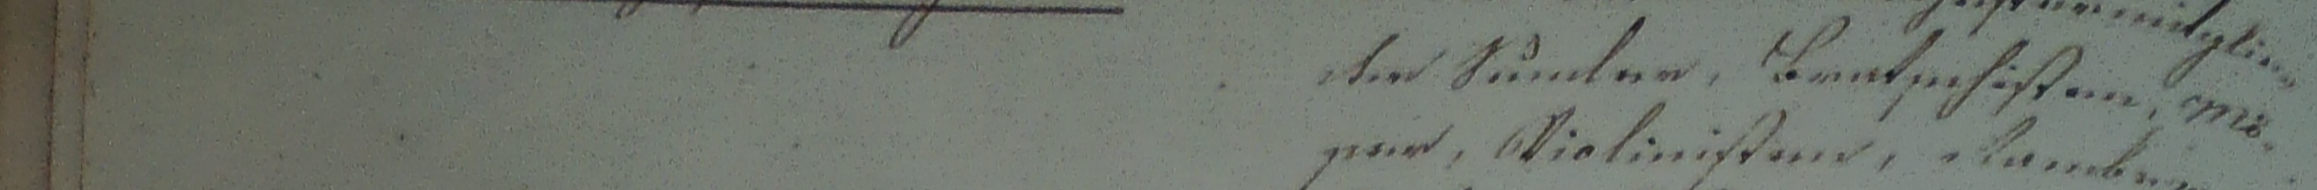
der Sunder, Bratschisten, Mö¬
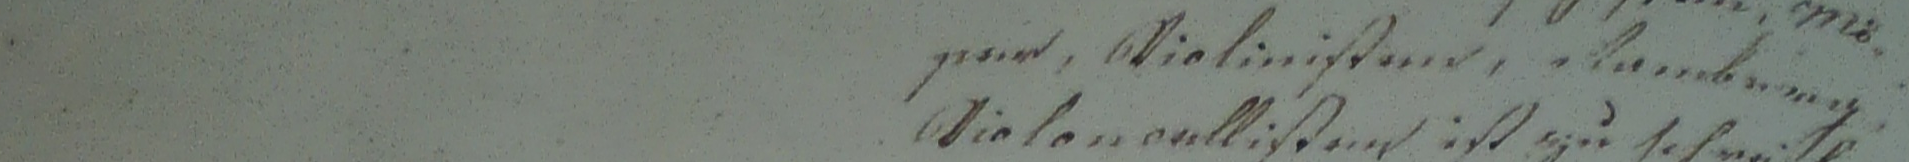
ser, Violinisten, Ramberg,
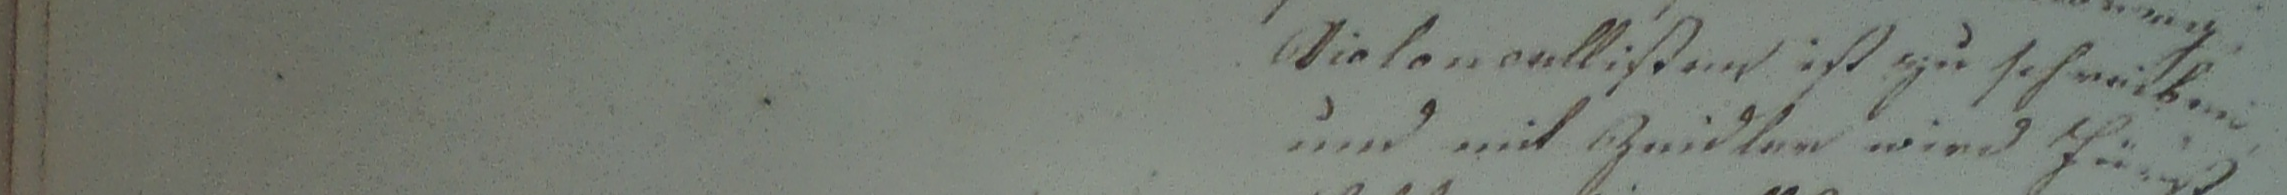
Violoncellisten ist zu schreiben
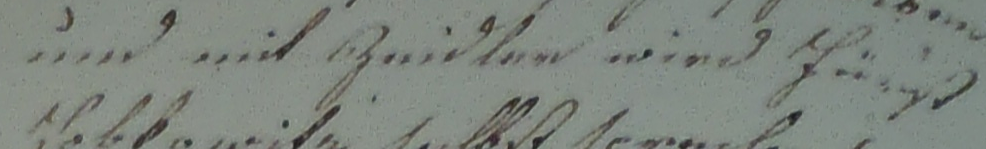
und mit Zeidler wird Fürst
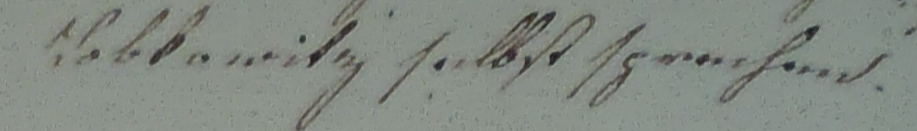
Lobkowitz selbst sprechen.
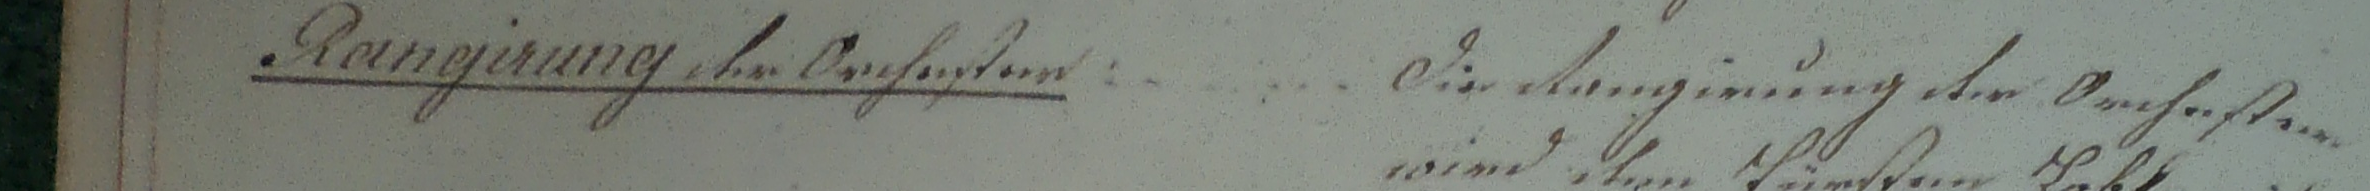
Rangirung der Orchester: ….. Die Rangirung der Orchester
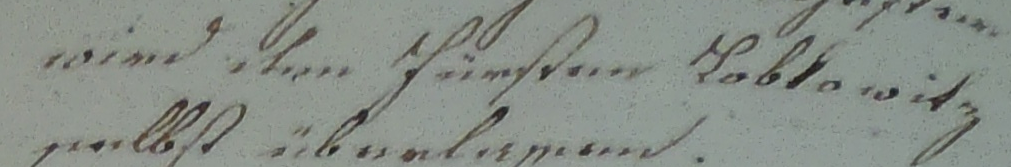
wird dem Fürsten Lobkowitz
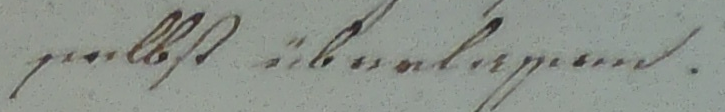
selbst überlassen.
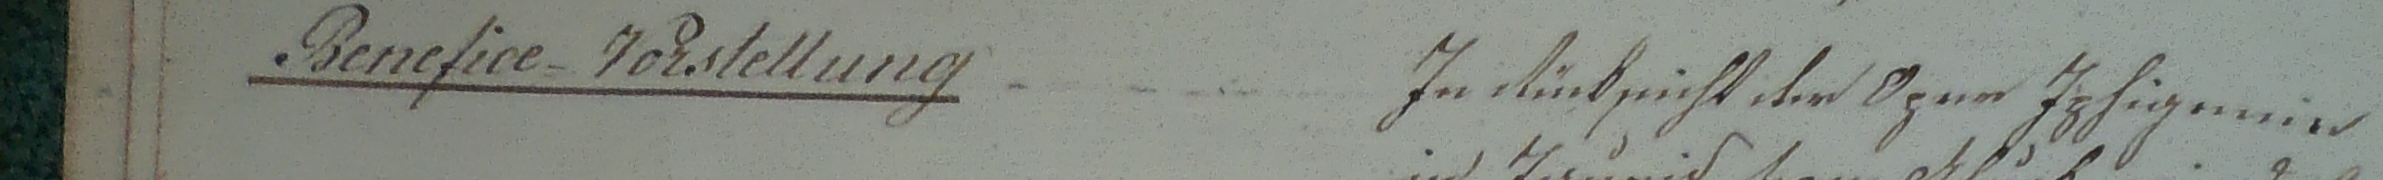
Benefice-Vorstellung …. In Rücksicht der Oper Iphigenie
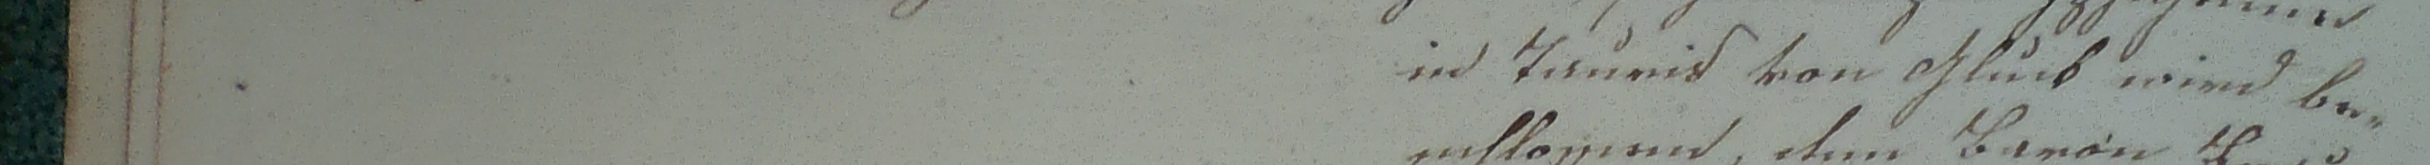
in Tauris von Gluck wird be¬
